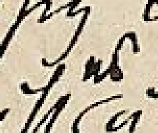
es
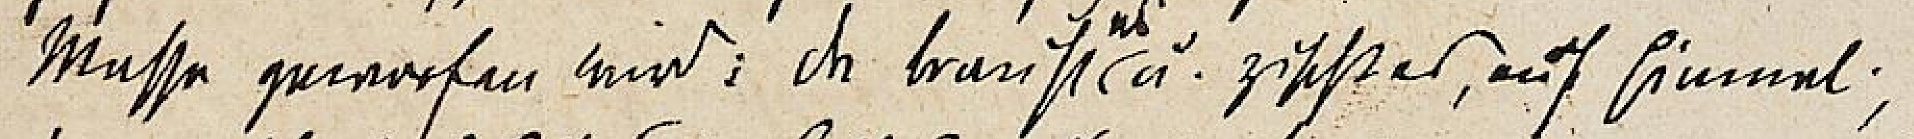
Masse geworfen wir: da braust (u. zischt es, auf Himmel;
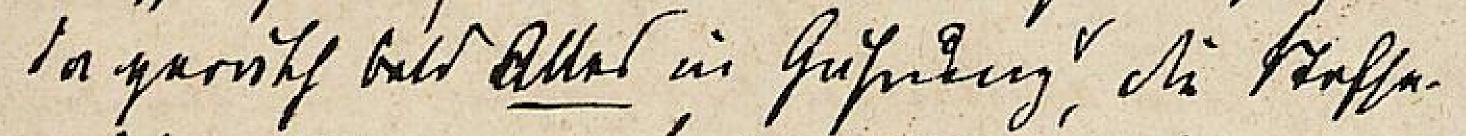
da gerräth bald Alles in Gährung, die Stoffe
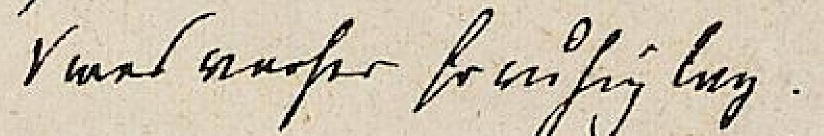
was vorher so ruhig lag
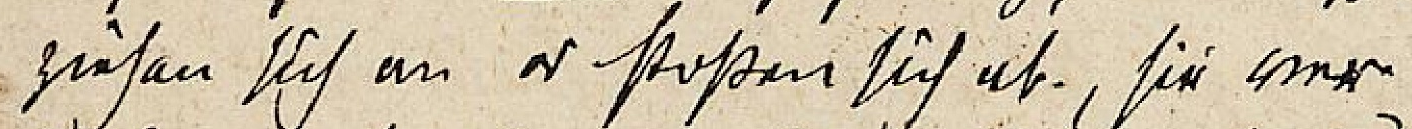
ziehen sich an od stoßen sich ab, sie ver¬
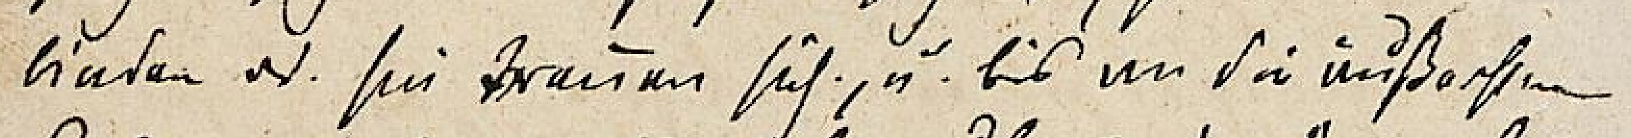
binden od sie trenen sich, u bis an die äußersten
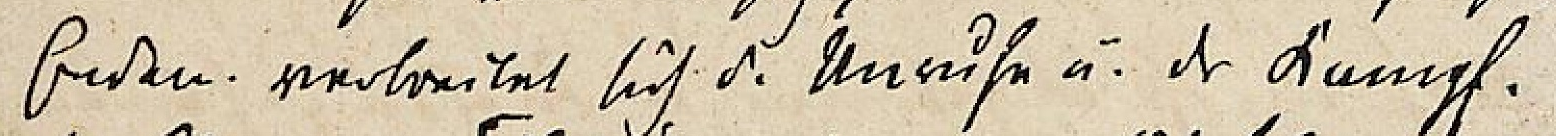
Enden verbreitet sich d. Unruhe u. dr Kampf.
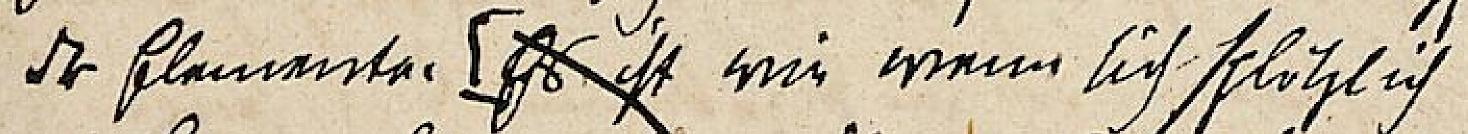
dr Elemente. [Es ist wie wenn sich plötzlich
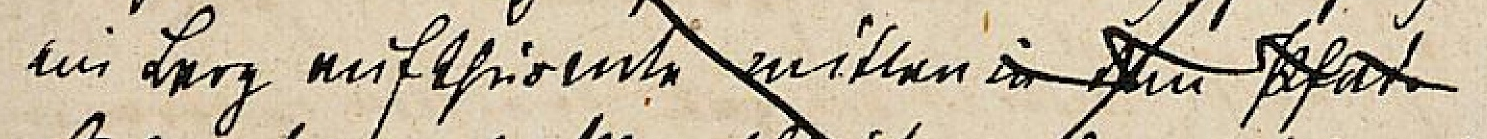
ein Berg aufthürmte mitten in dem Pfad
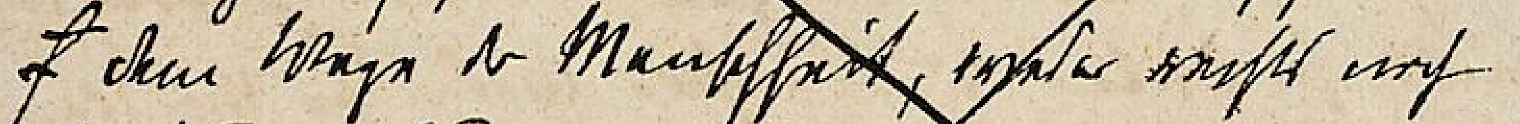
f dem Wege dr Menschheit, weder rechts noch
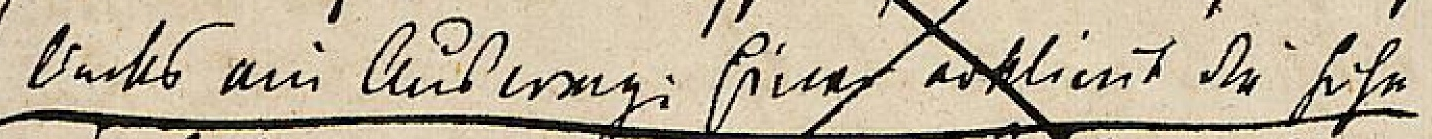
links ein Ausweg: Einer erklimt die Höhe
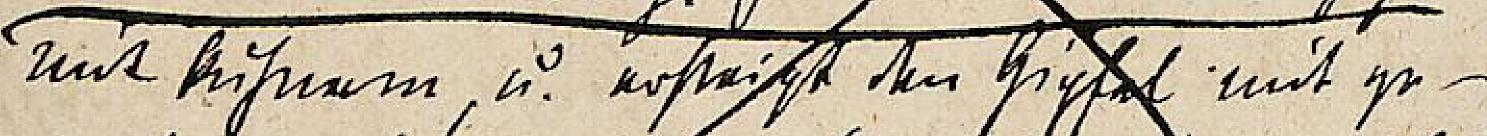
mit Stöhnen, u. ersteigt den Gipfel mit ge¬
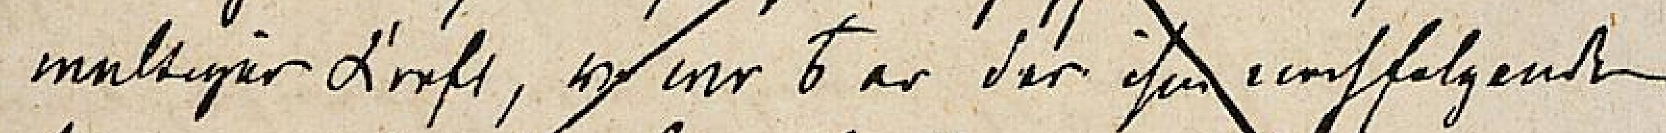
waltiger Kraft, v. wo s er der ihm nachfolgende
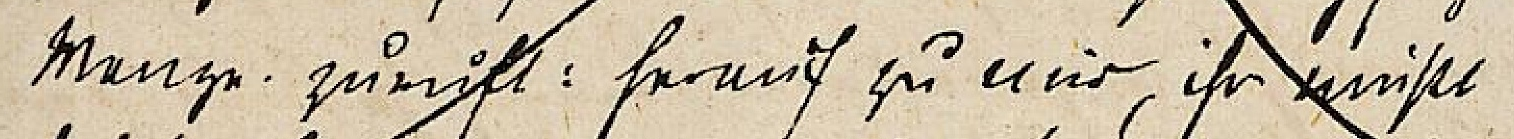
Menge zureicht: herauf zu nur, ihr müßt
